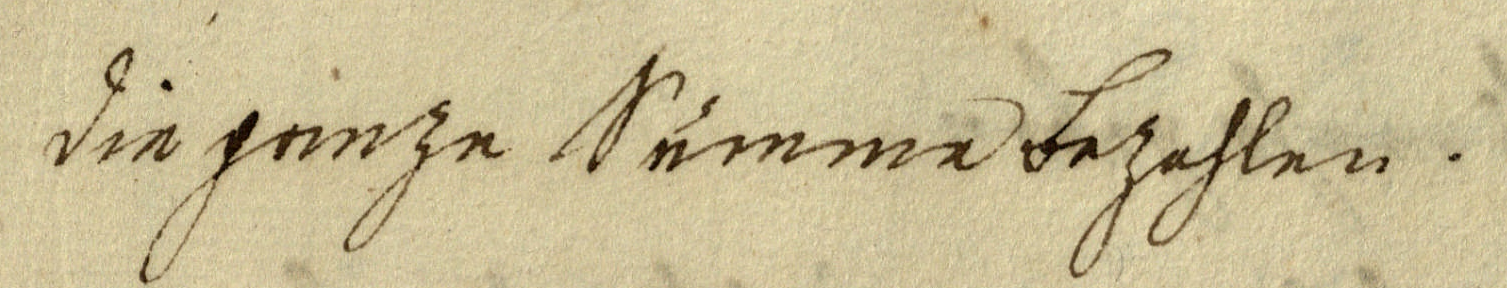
die ganze Summe bezahlen.
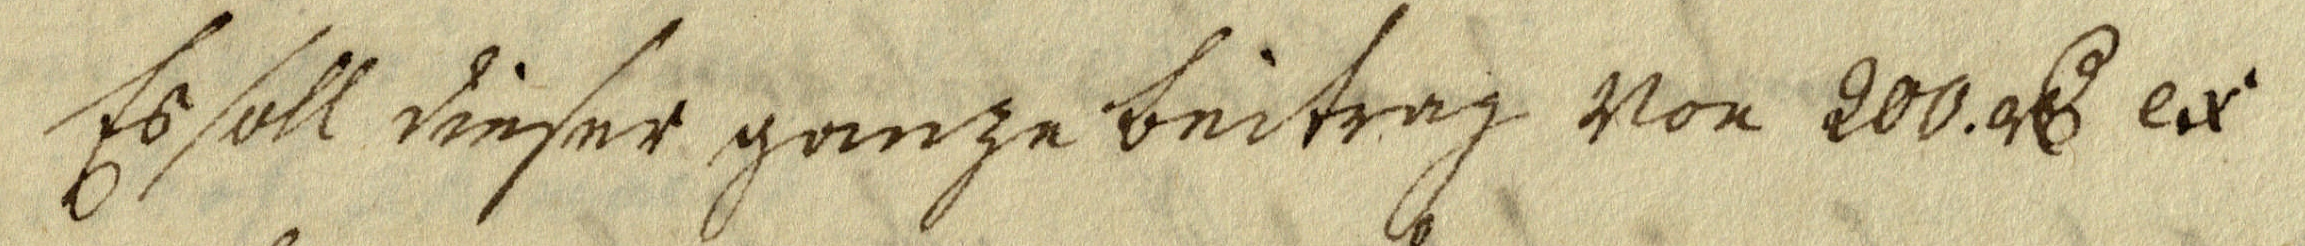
Es soll dieser ganze Beitrag von 200. r. ex
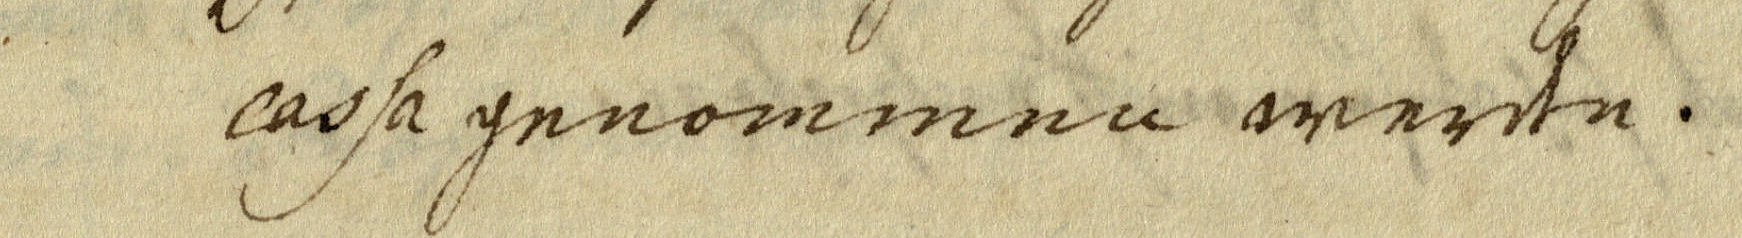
cassa genommen werden.
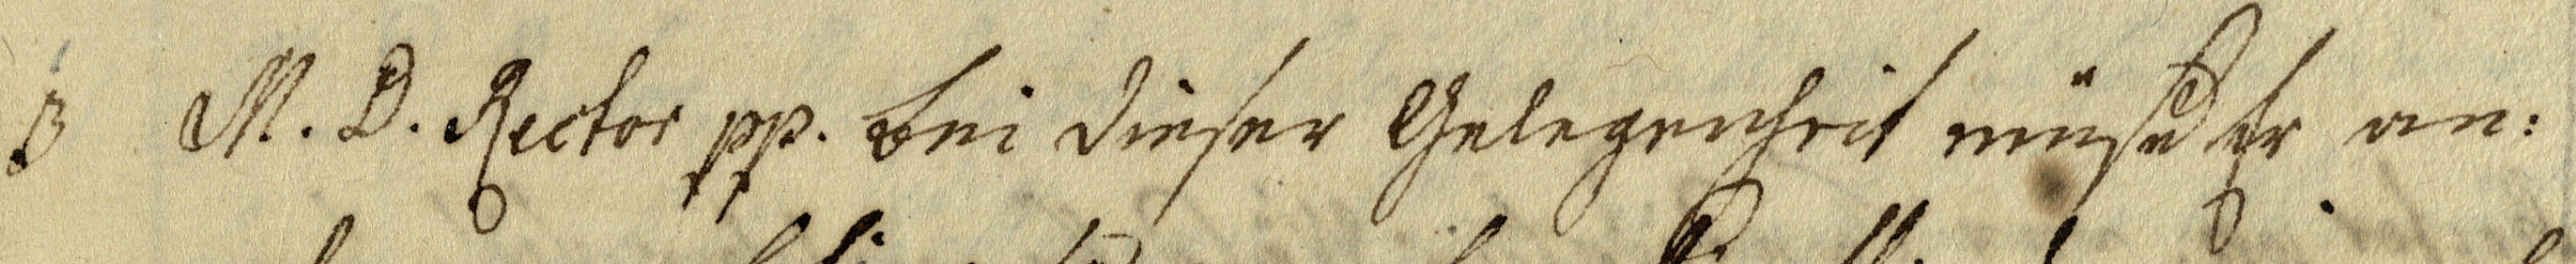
3. M. D. Rector pp. Bei dieser Gelegenheit müße Er an¬
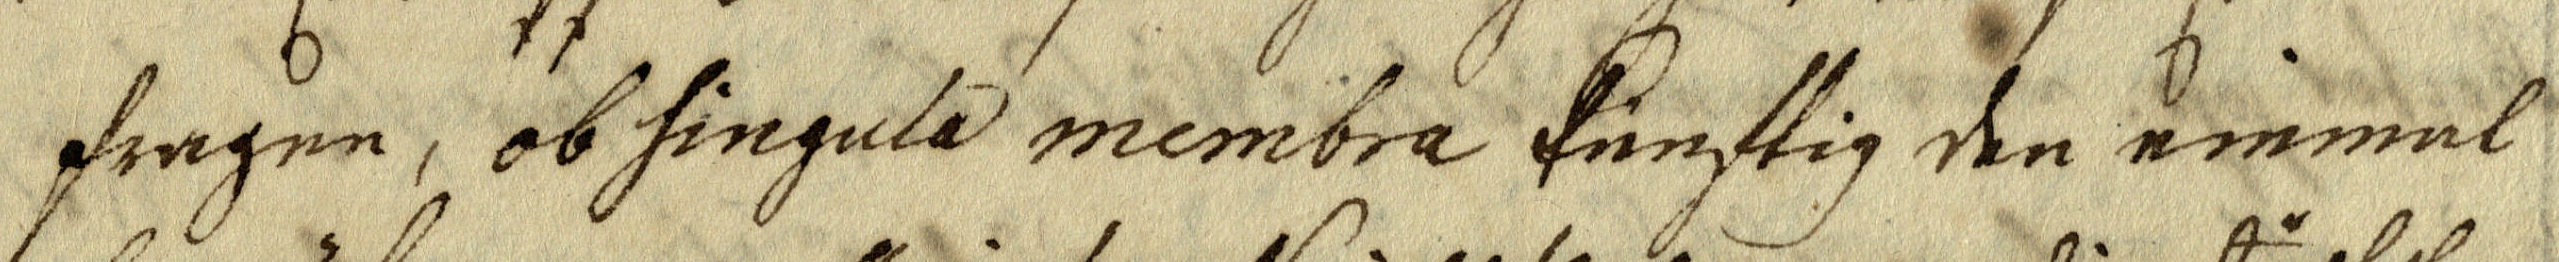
fragen, ob singula membra künftig den einmal
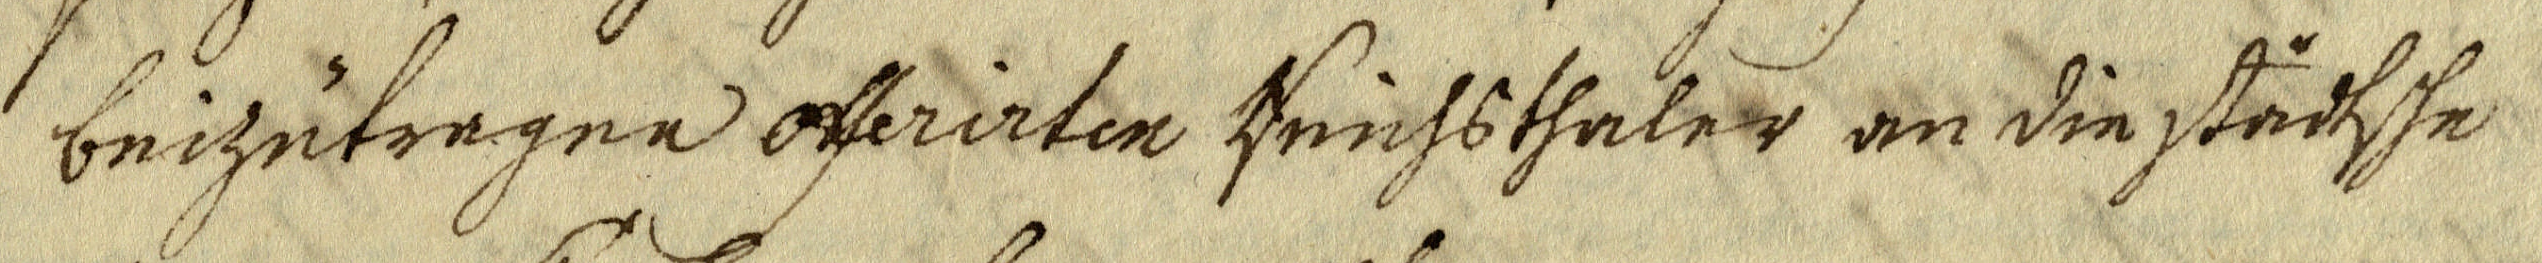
beizutragen offerirten Reichsthaler an die städtsche
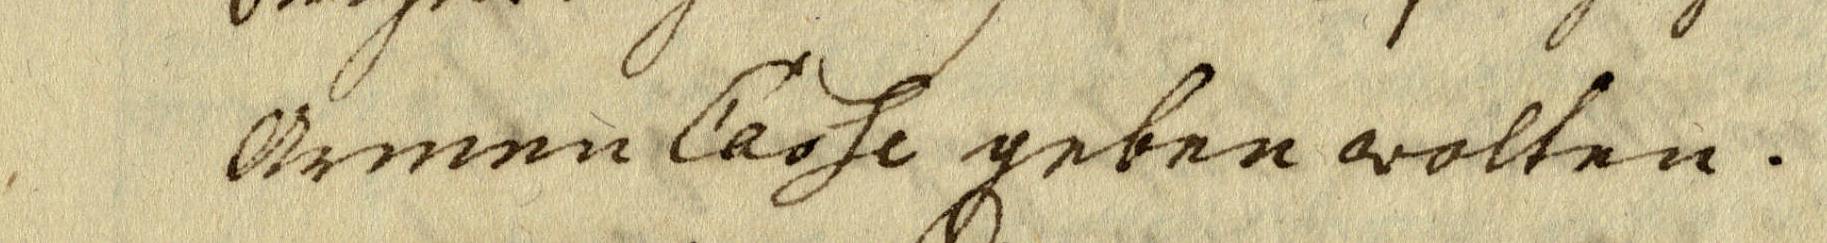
Armen Casse geben wolten.
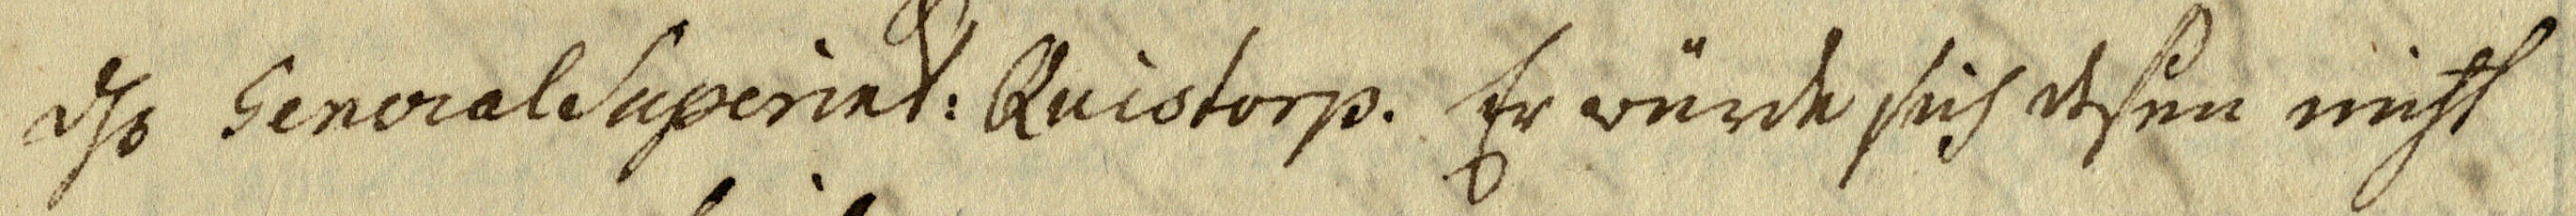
dh GeneralSuperint: Quistorp. Er würde sich dessen nicht
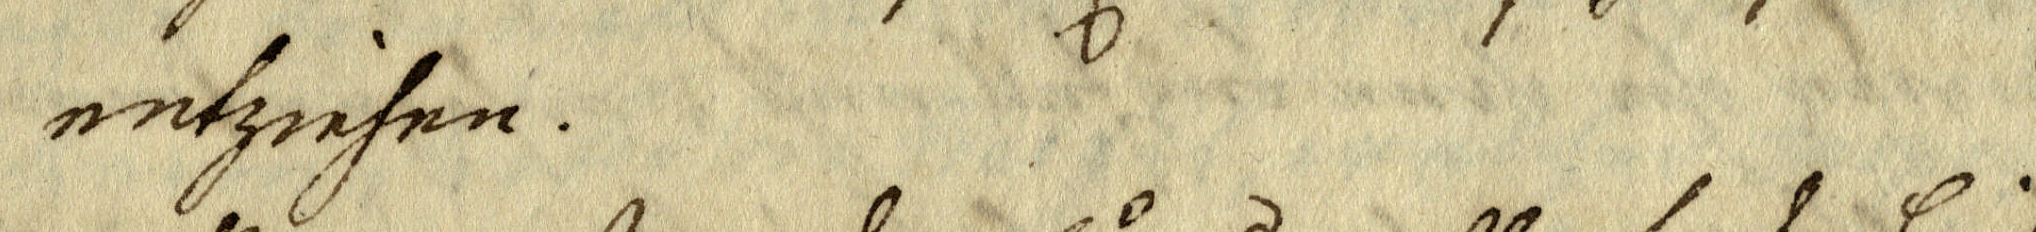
entziehen.
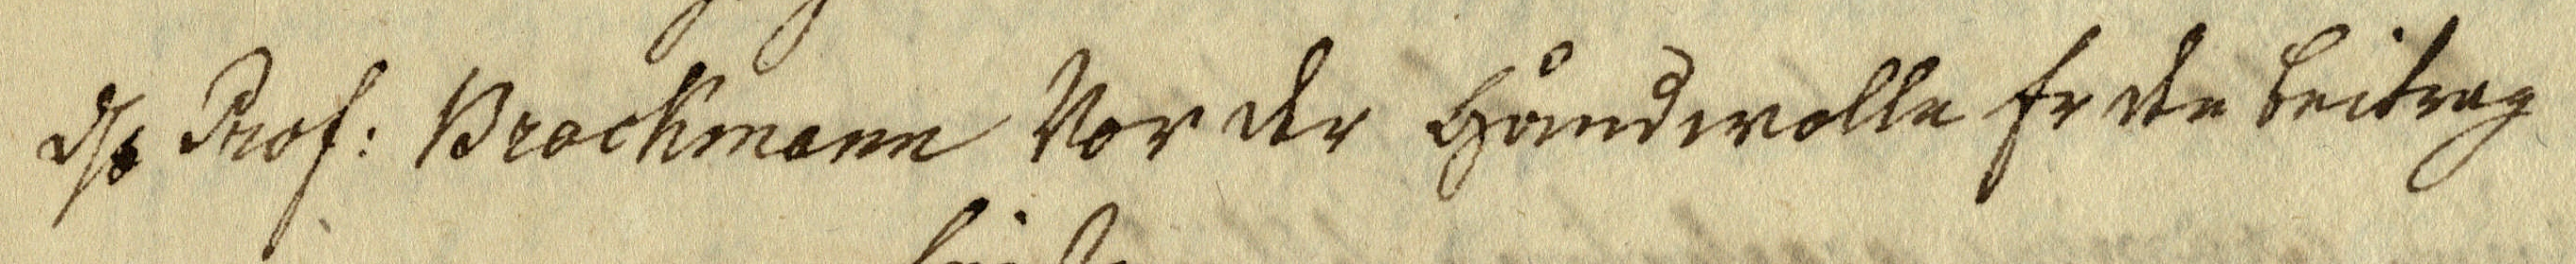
dh Prof: Brockmann Vor der Hand wolle Er den Beitrag
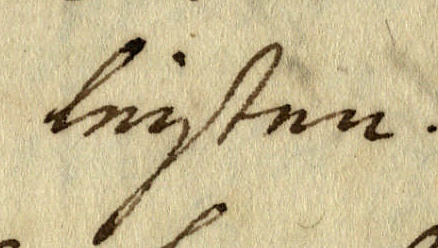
leisten.
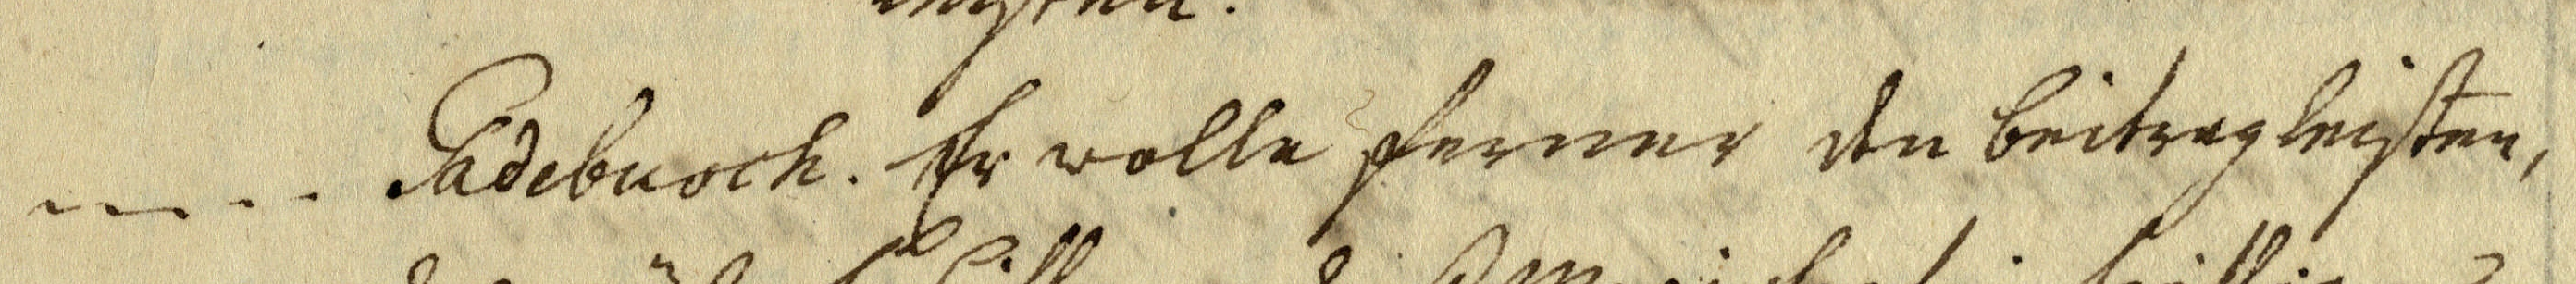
Gadebusch. Er wolle ferner den Beitrag leisten,
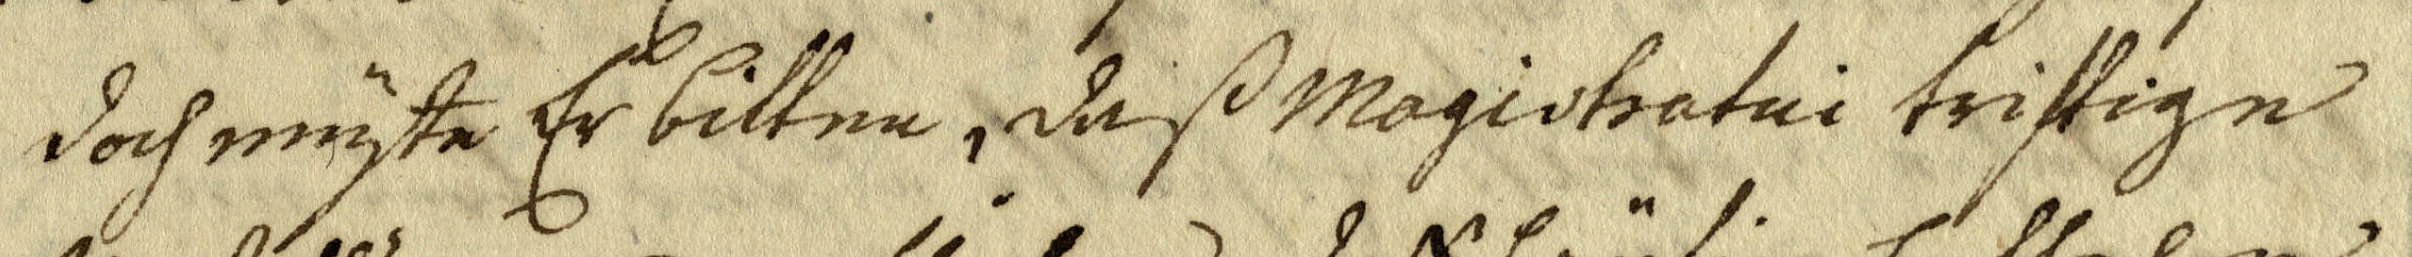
doch müste Er bitten, daß Magistratui triftige
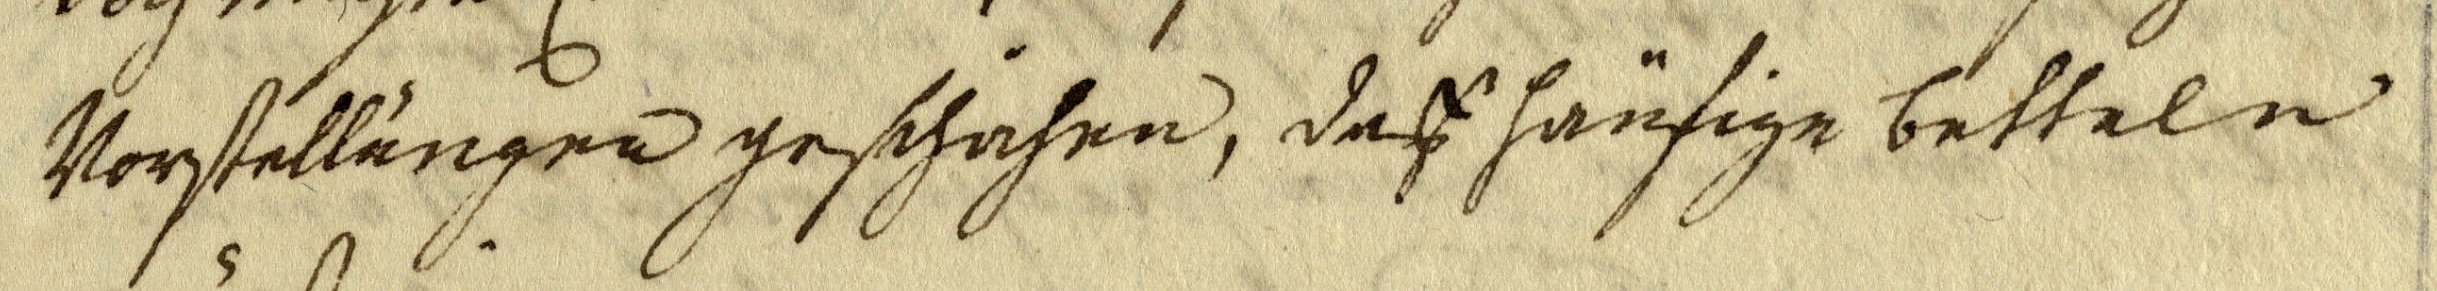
Vorstellungen geschähen, das häufige betteln
